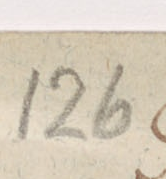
126
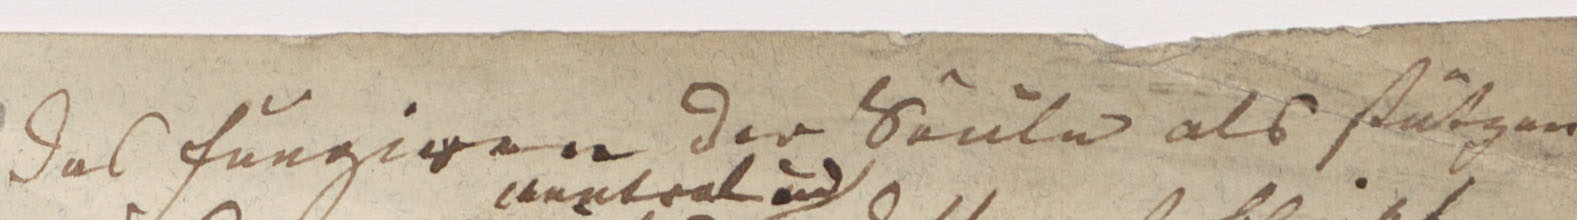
das Fungiren der Säule als stützen
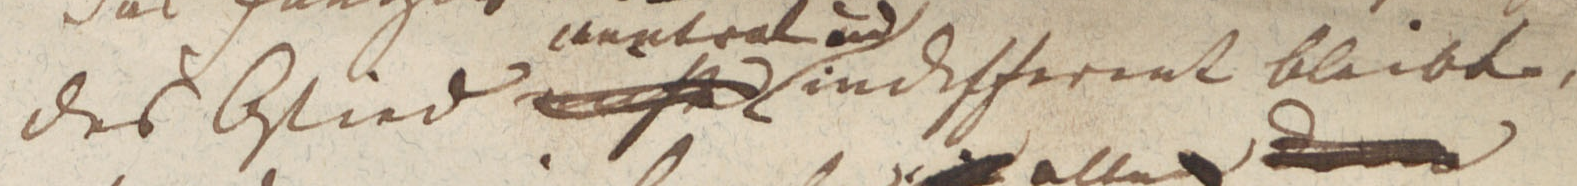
des Glied nicht neutral und indifferent bleibt,
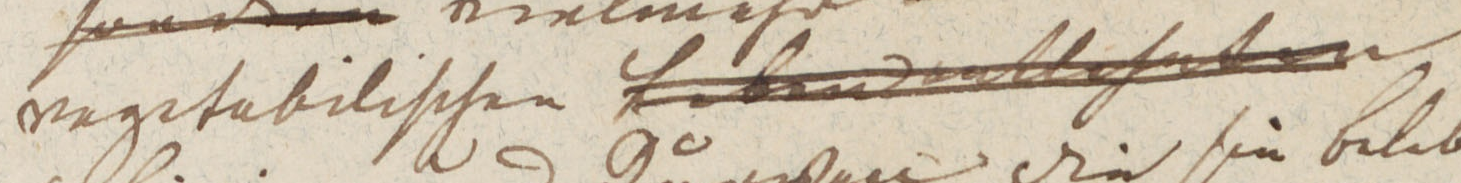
vegetabilischen Leben entlehnten
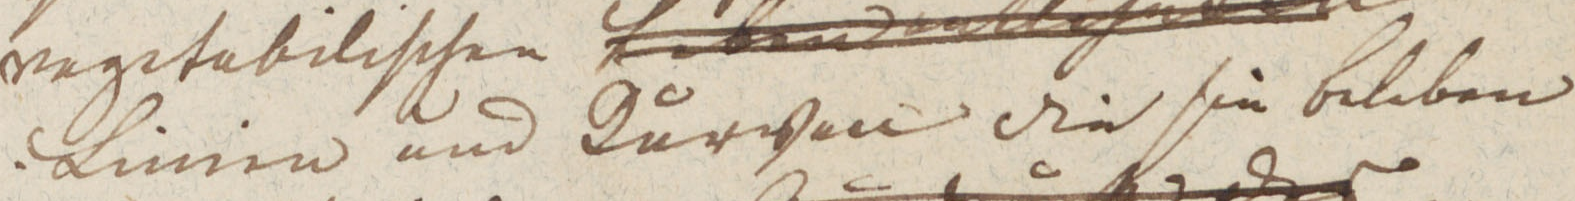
Linien und Kurven die sie beleben
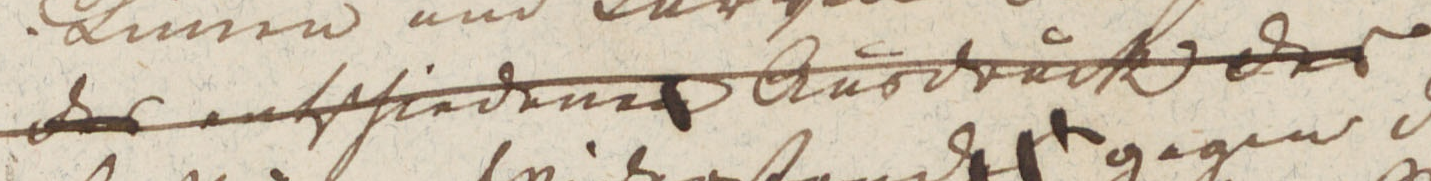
des entschiedenen Ausdruck der
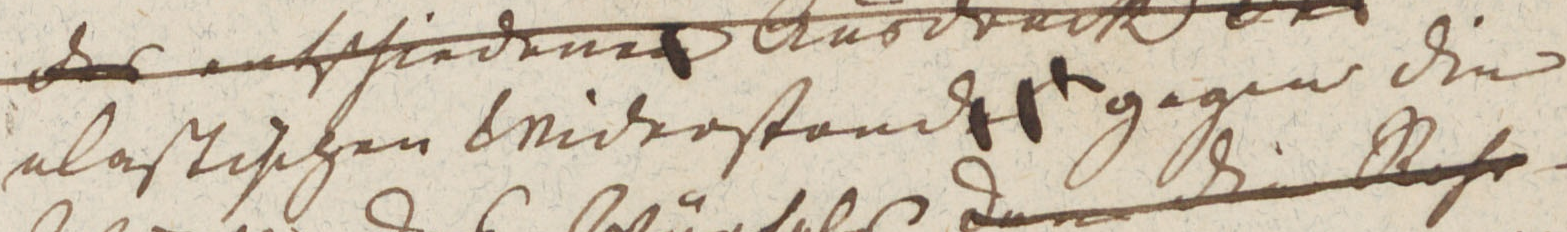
elastischen Widerstandes gegen die
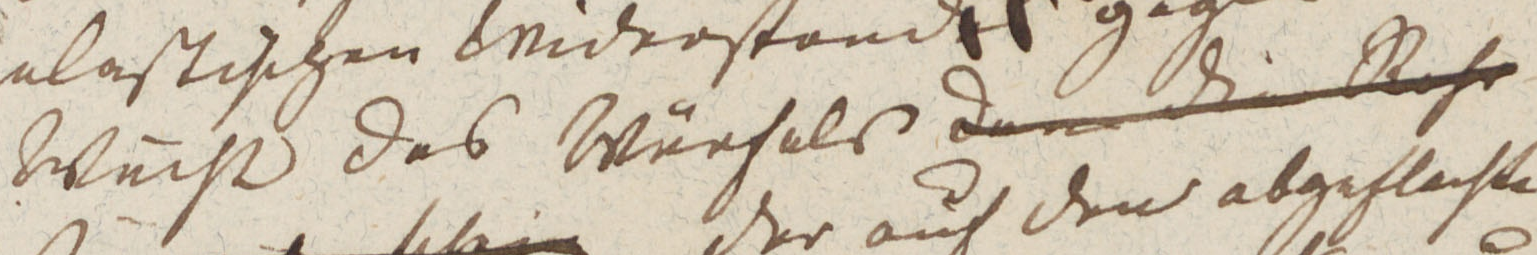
Wucht des Würfels den die Rohr-
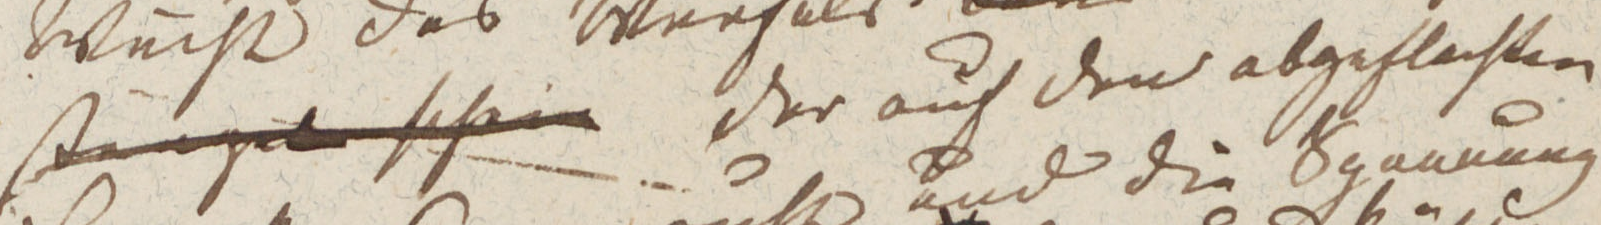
stängel schein der auf den abgeflachten
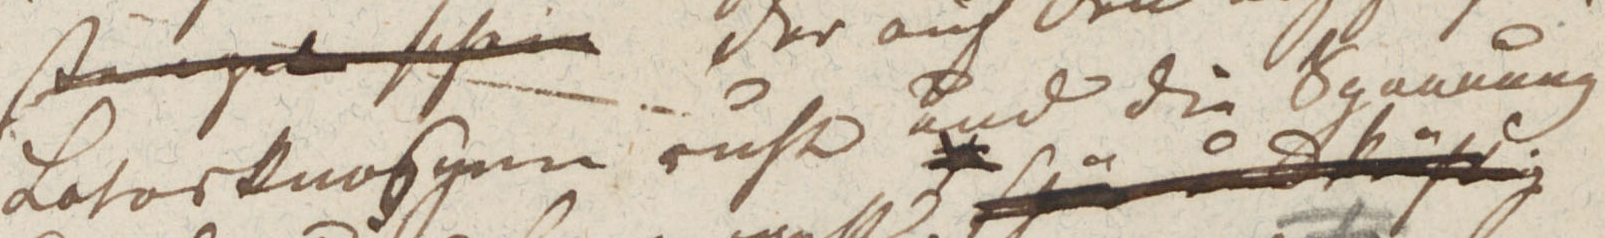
Lotosknospen ruht und die Spannung
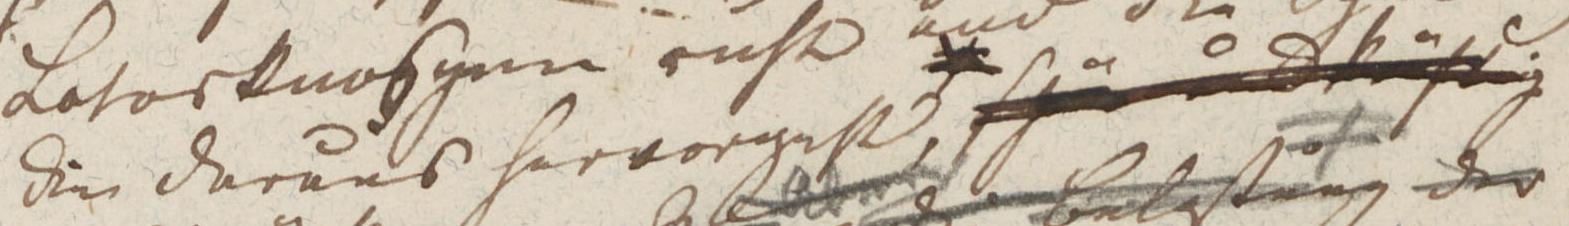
die daraus hervorgeht, % sch und kräftig
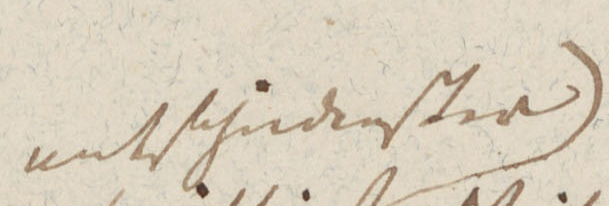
entschiedenster
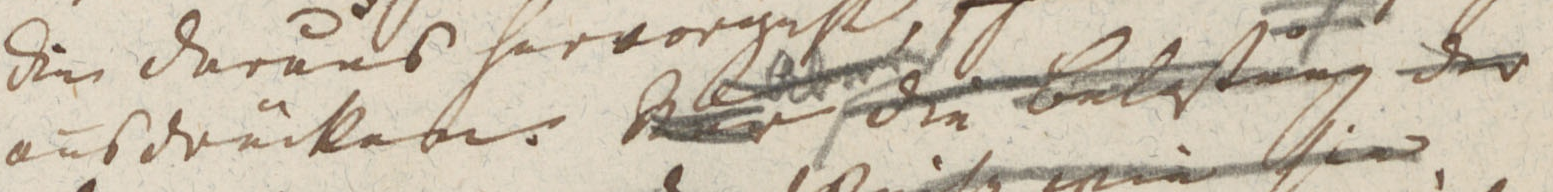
ausdrücken. Nur Aber die Belastung % der
